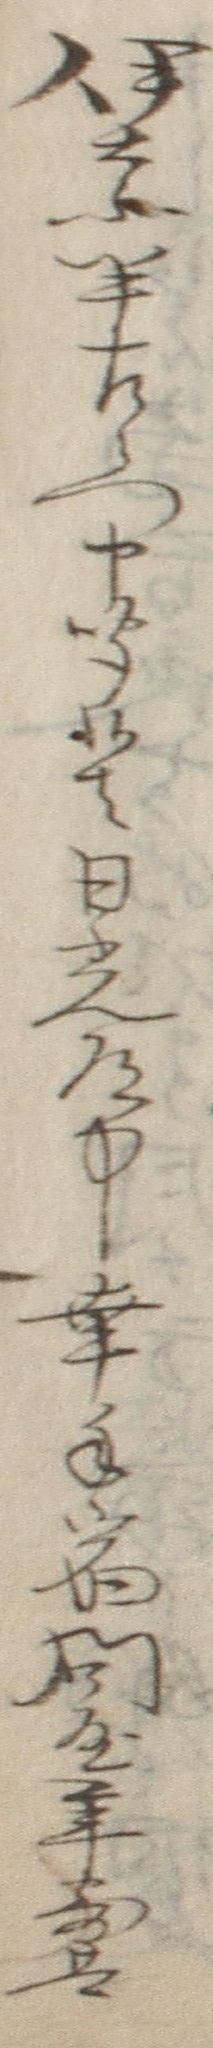伊奈半左衛門申聞候は日光道中幸手宿問屋年寄共

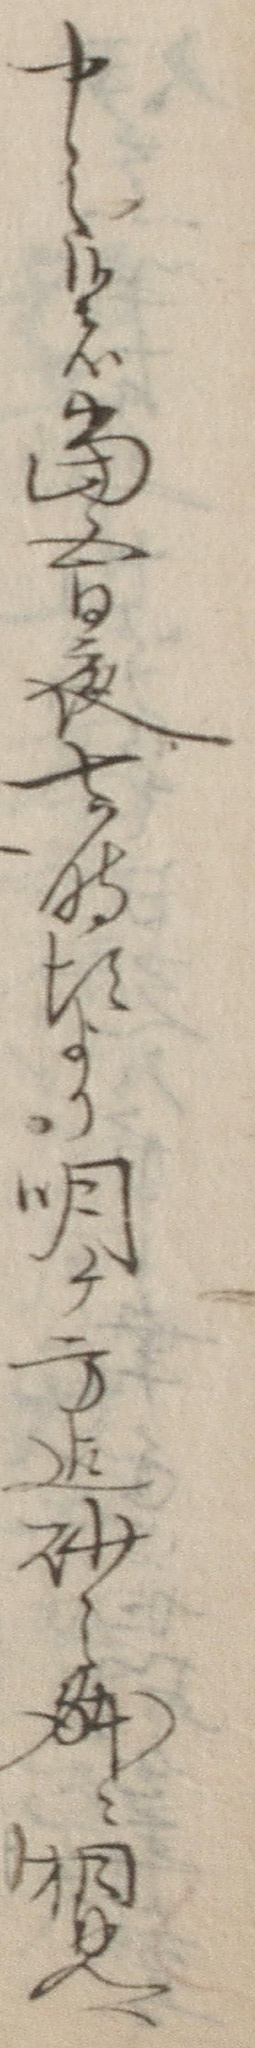申之候は当五日夜七ツ時頃より明ケ方迄砂之躰ニ相見へ
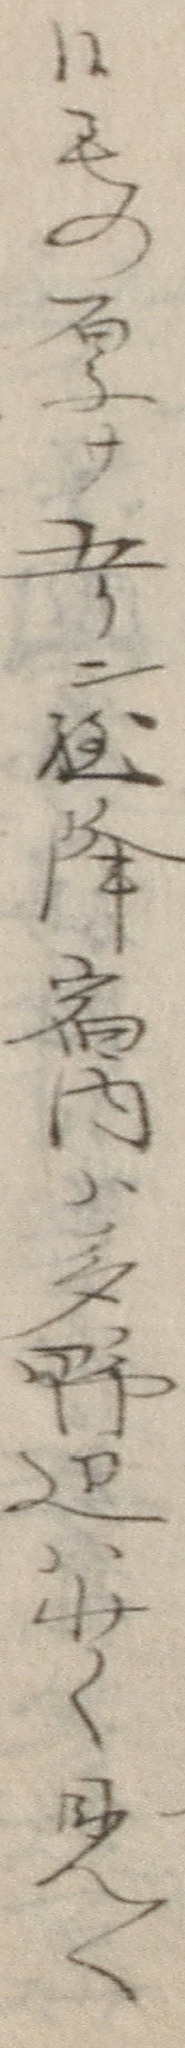候もの厚サ五リン程降宿内ハ多野辺ハ少々見へ
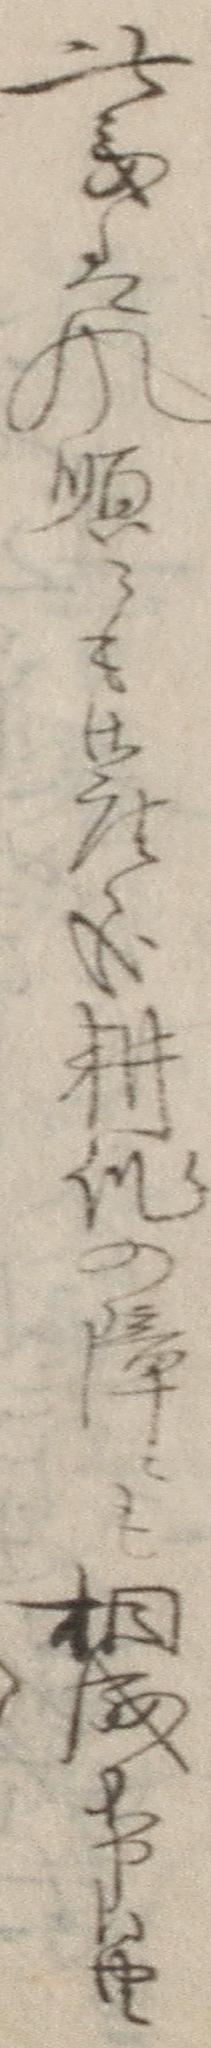此義は風順にも御座候哉耕作の障ニモ相成不申候由
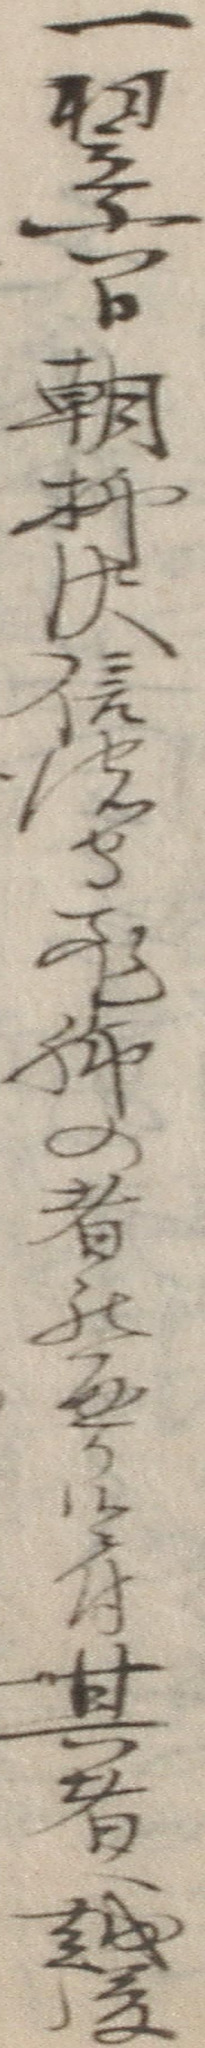一翌六日朝柳沢信濃守飛脚の者罷通り候ニ付其者へ越後
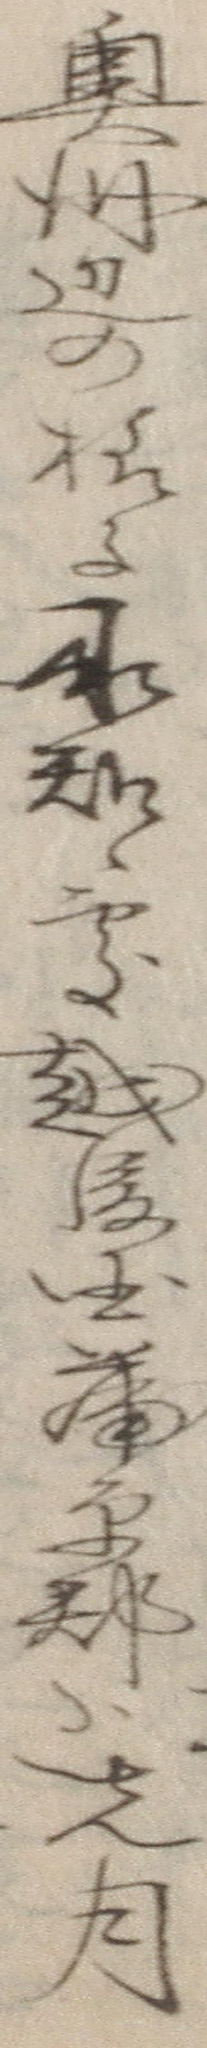奥州辺の様子承知候処越後国蒲原郡ハ先月
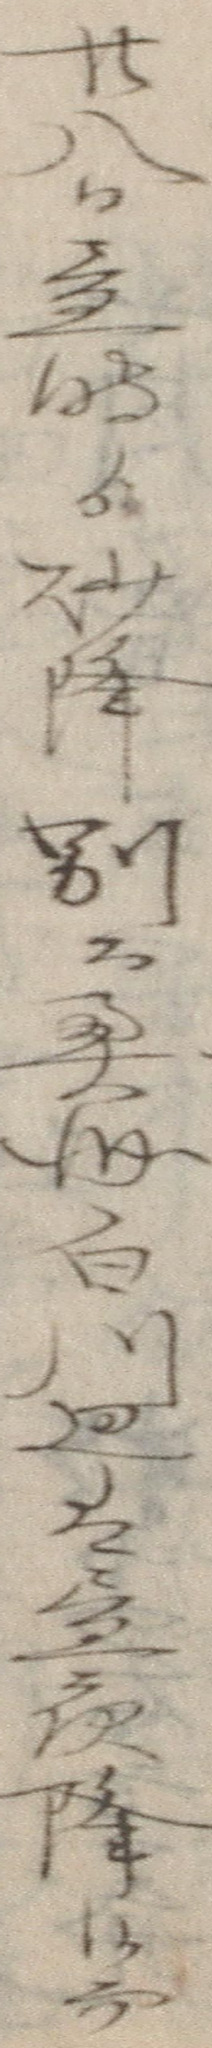廿八日昼時ゟ砂降別而奥州白川辺は昼夜降候而
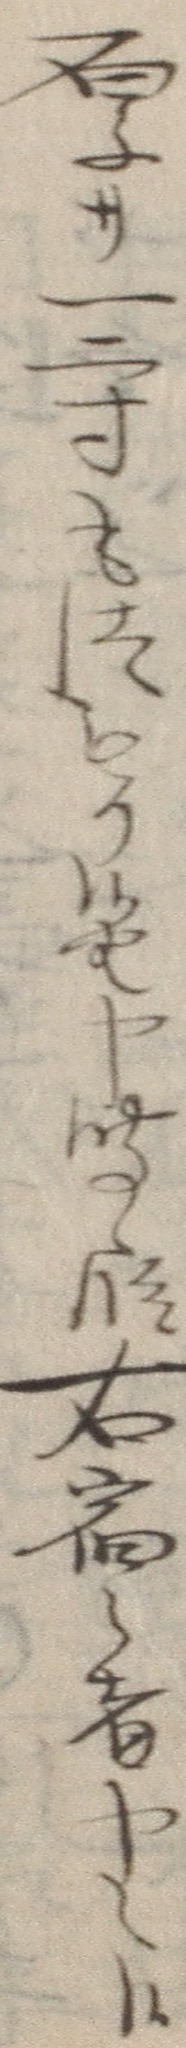厚サ一二寸もつもり候由申聞候段右宿之者申之候
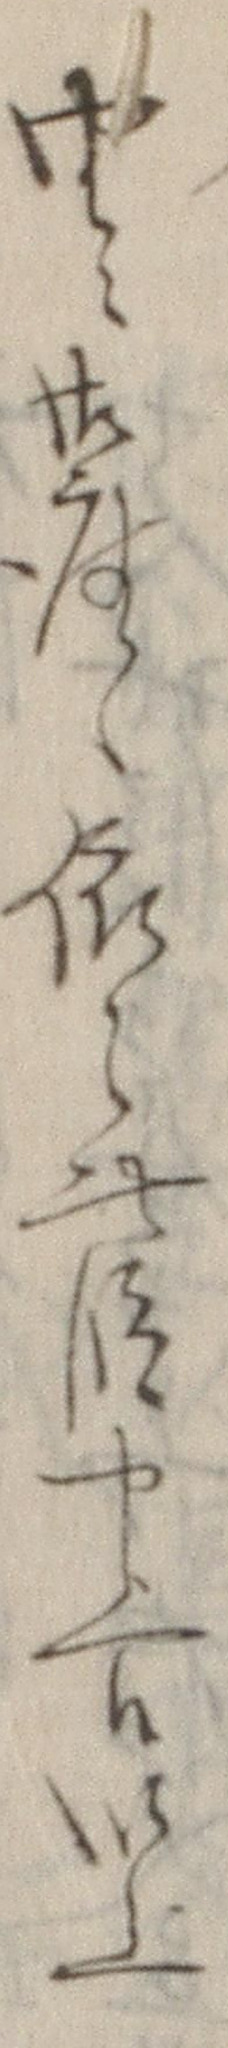由ニ御座候依之此段申上候以上
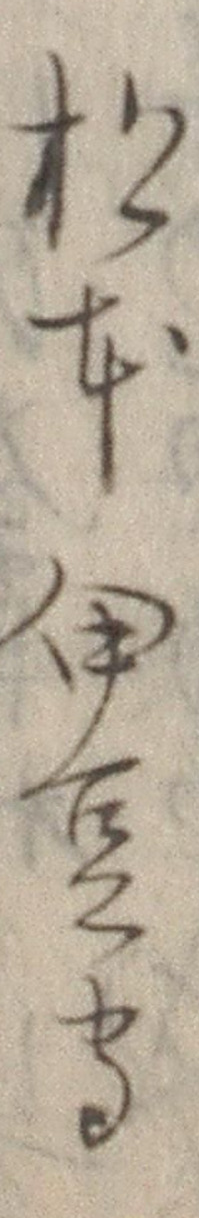松本伊豆守
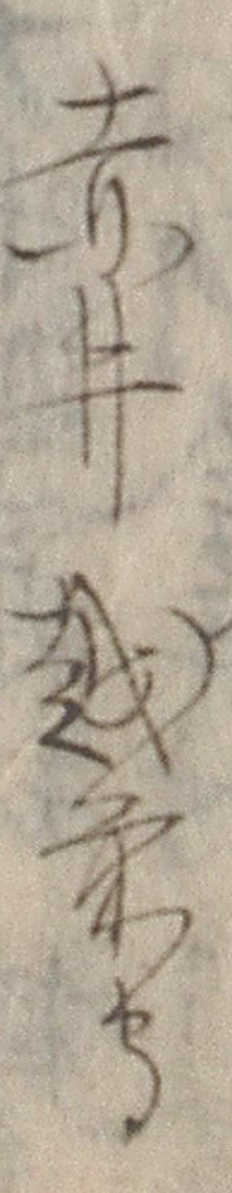赤井越前守
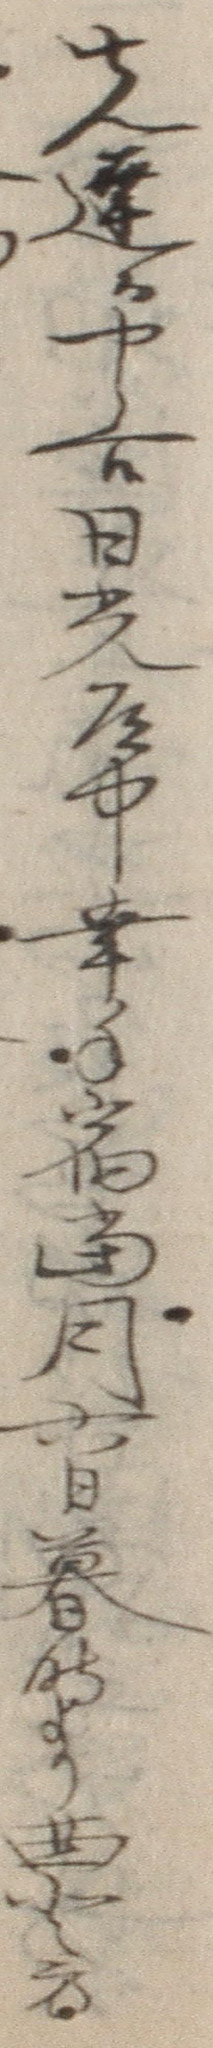先達而申上候日光道中幸手宿当月六日暮時より西北之方
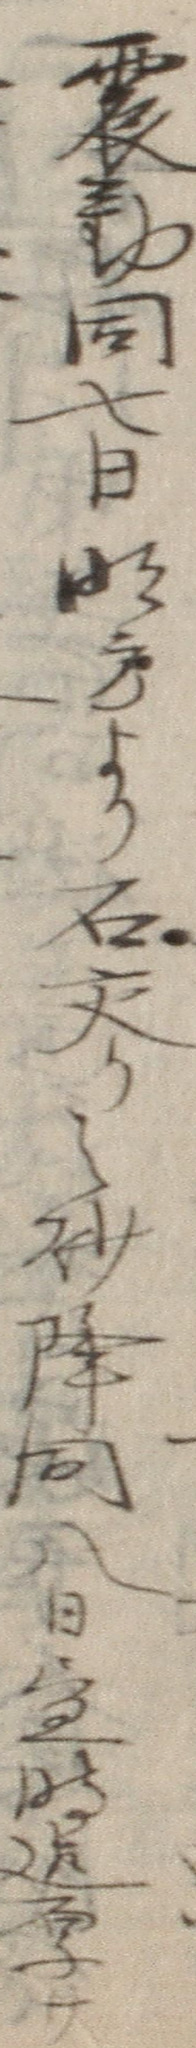震動同七日明方より石交り之砂降同八日昼時迄厚サ
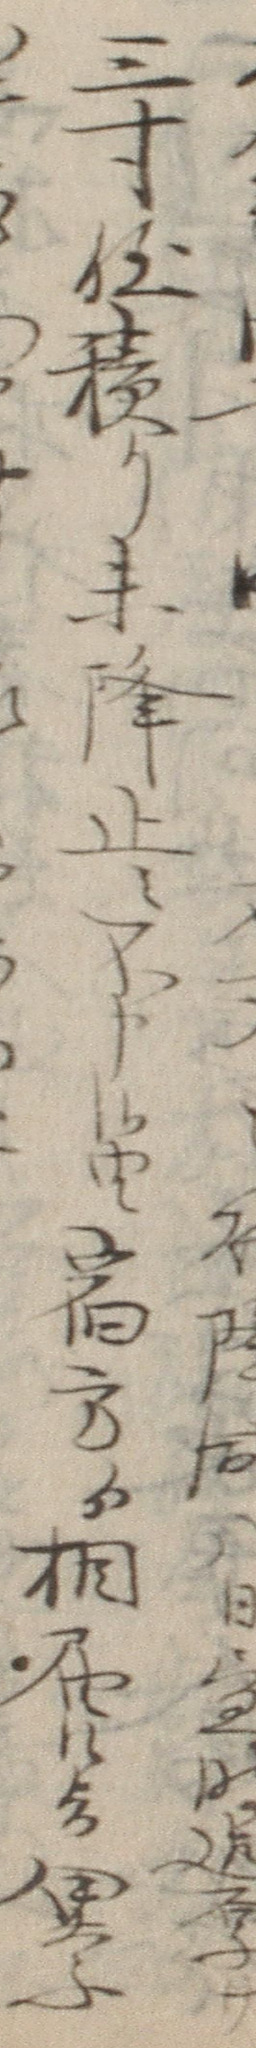三寸程積り未降止ミ不申候由宿方ゟ相届候旨伊奈
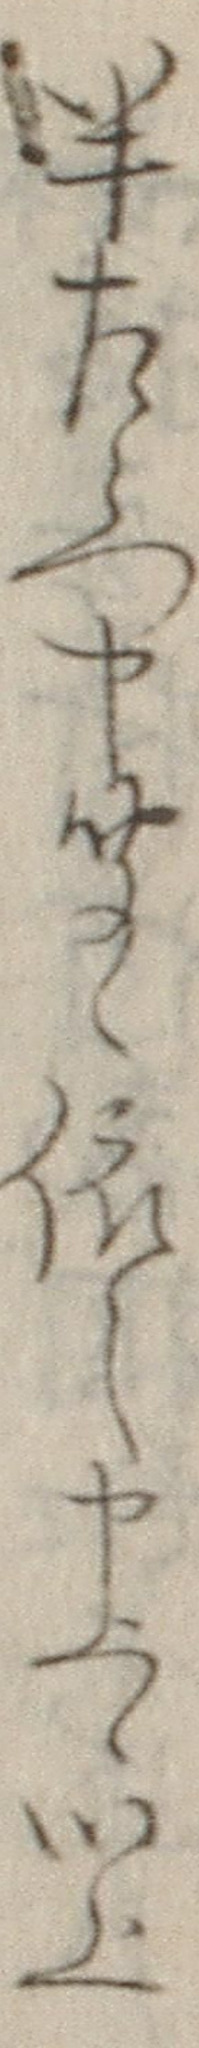半左衛門申聞候依之申上候以上
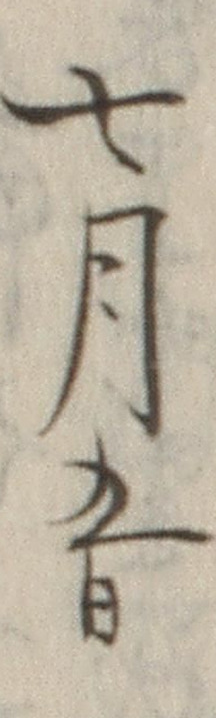七月九日
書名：[諸国災害記録]
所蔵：東京大学地震研究所図書室 Earthquake Research Institute Library, The University of Tokyo, JAPAN
